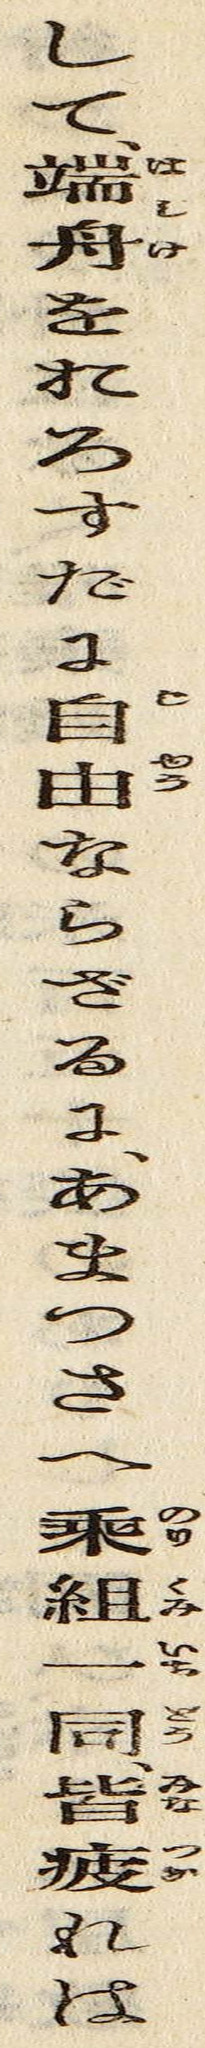して、端舟をおろすだに自由ならざるに、あまつさへ乗組一同、皆疲れは
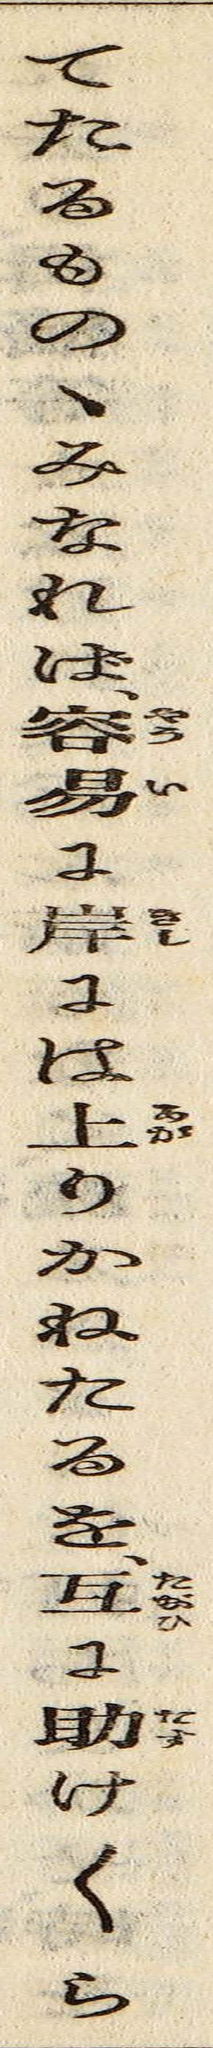てたるものゝみなれば、容易に岸には上りかねたるを、互に助け〳〵ら
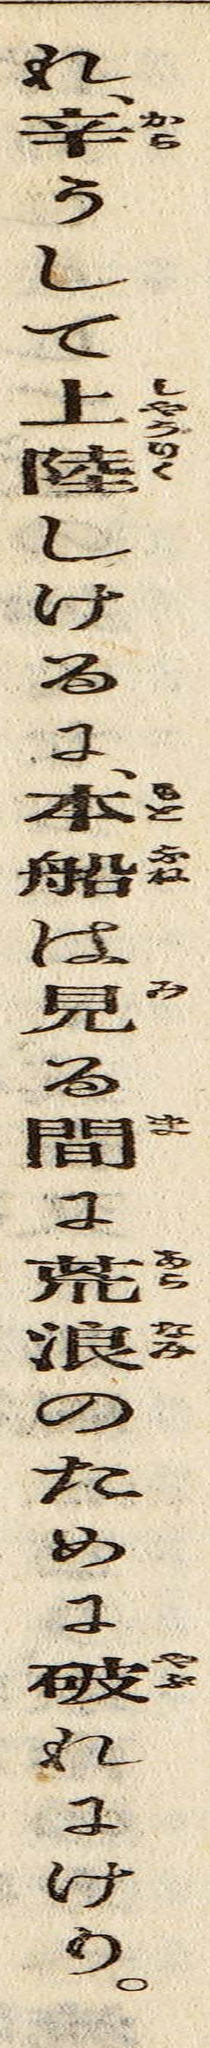れ、辛うして上陸しけるに、本船は見る間に荒浪のために破れにけり。
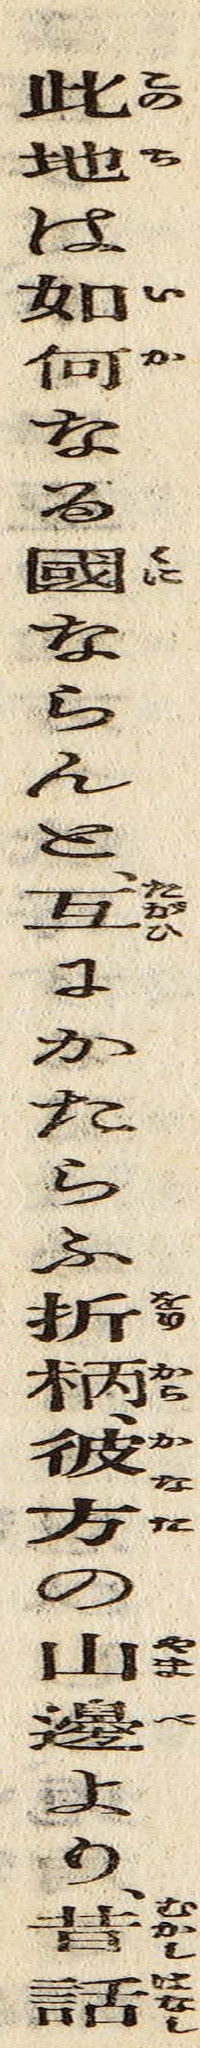此地は如何なる国ならんと、互にかたらふ折柄、彼方の山辺より、昔話
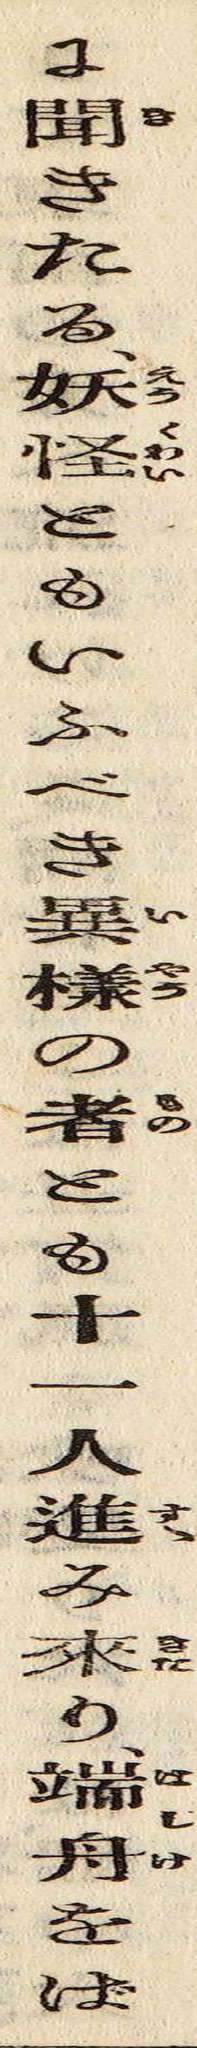に聞きたる、妖怪ともいふべき異様の者とも十一人進み来り、端舟をば
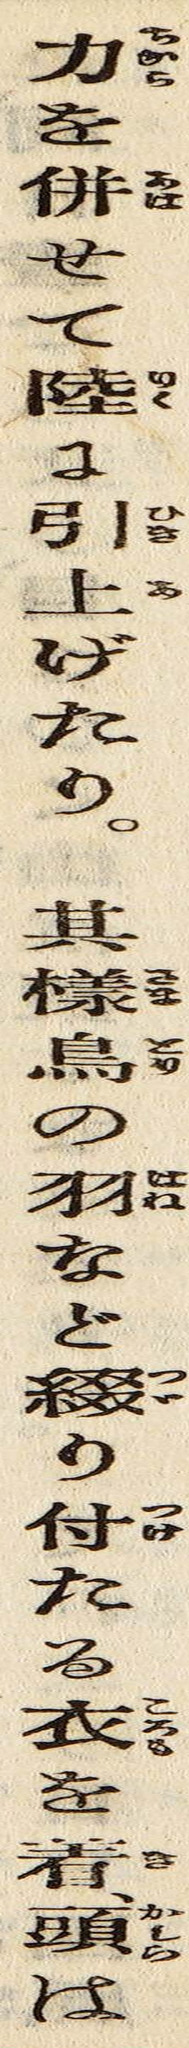力を併せて陸に引上げたり。其様鳥の羽など綴り付たる衣を着、頭は
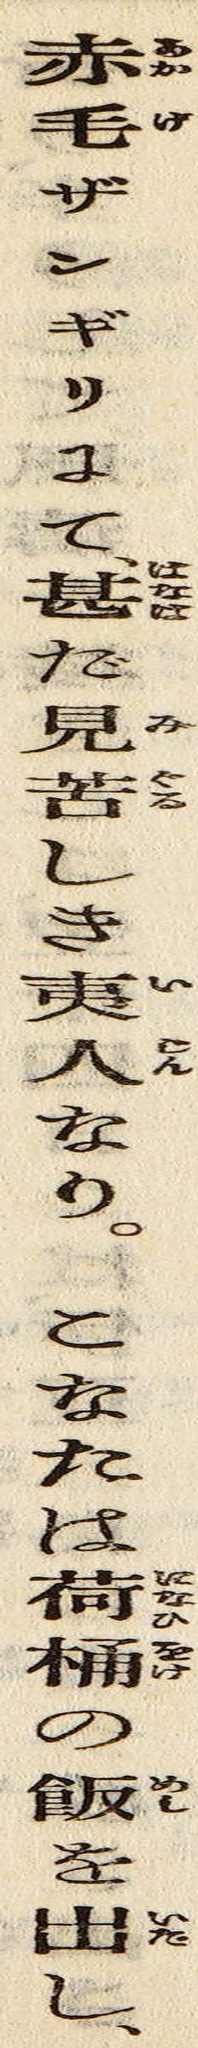赤毛ザンギリにて、甚だ見苦しき夷人なり。こなたは荷桶の飯を出し、
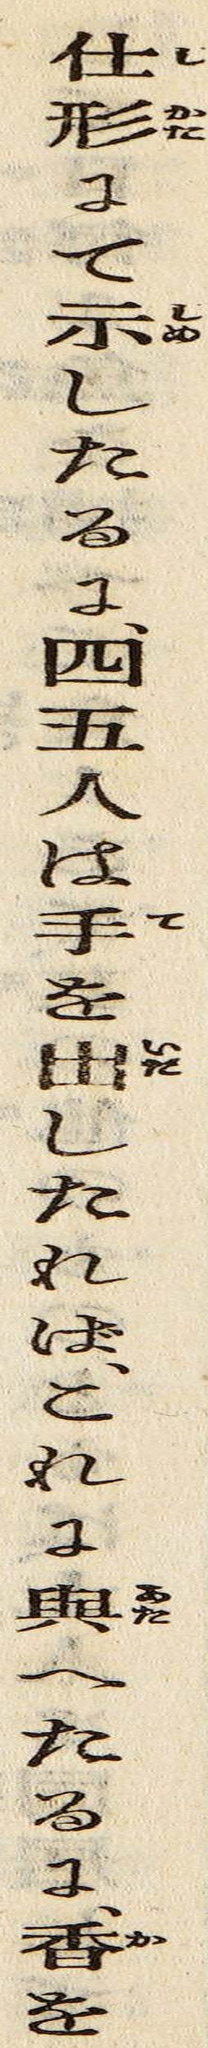仕形にて示したるに、四五人は手を出したれば、これに与へたるに、香を
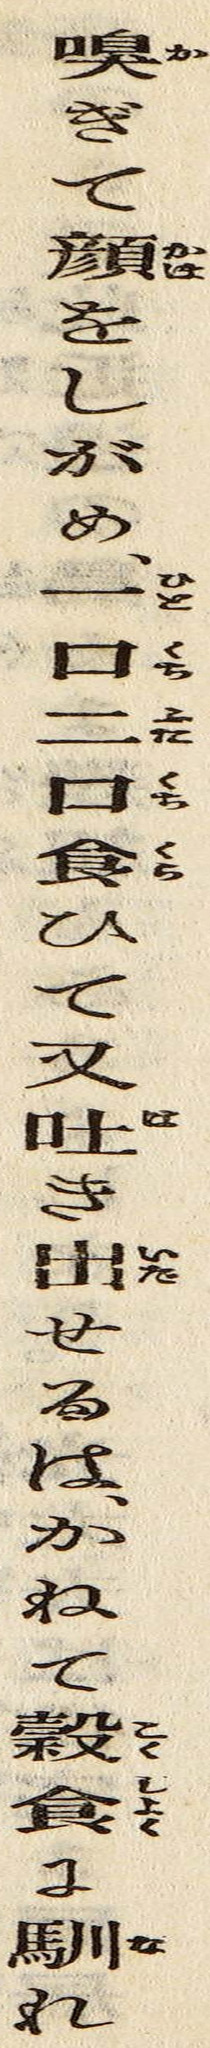嗅ぎて顔をしがめ、一口二口食ひて又吐き出せるは、かねて穀食に馴れ
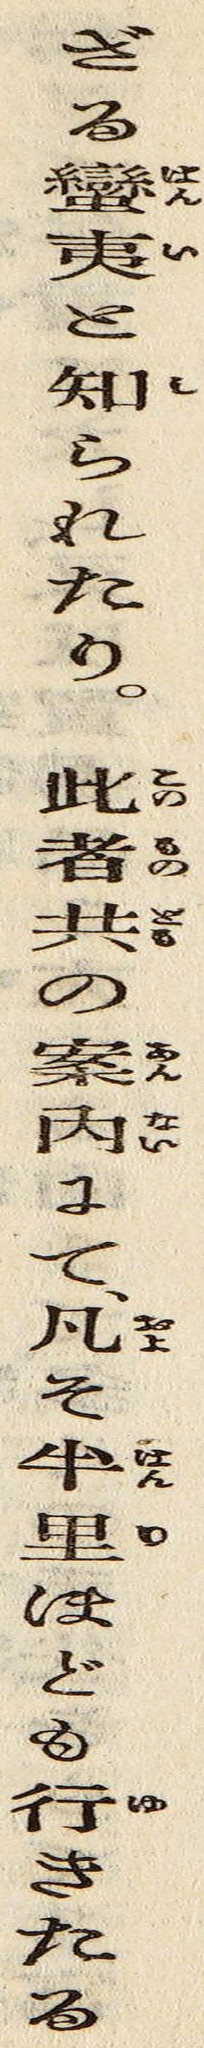ざる蛮夷と知られたり。此者共の案内にて、凡そ半里ほども行きたる
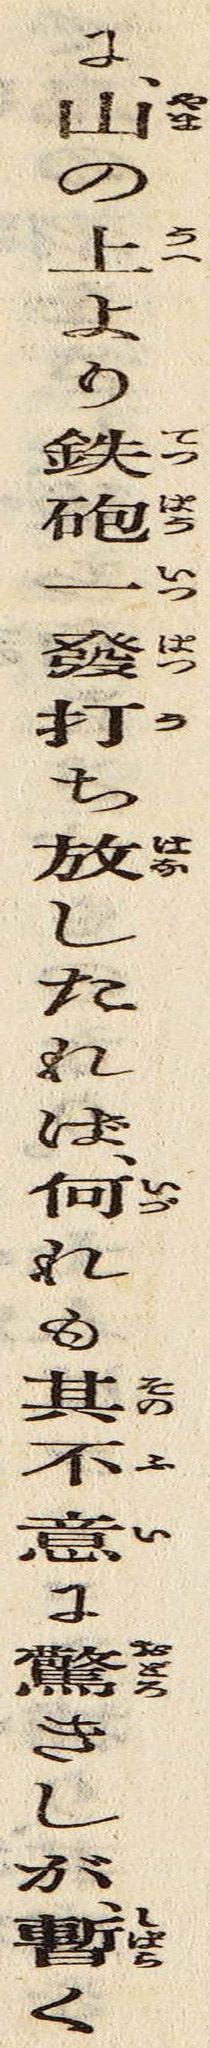に、山の上より鉄砲一発打ち放したれば、何れも其不意に驚きしが、暫く
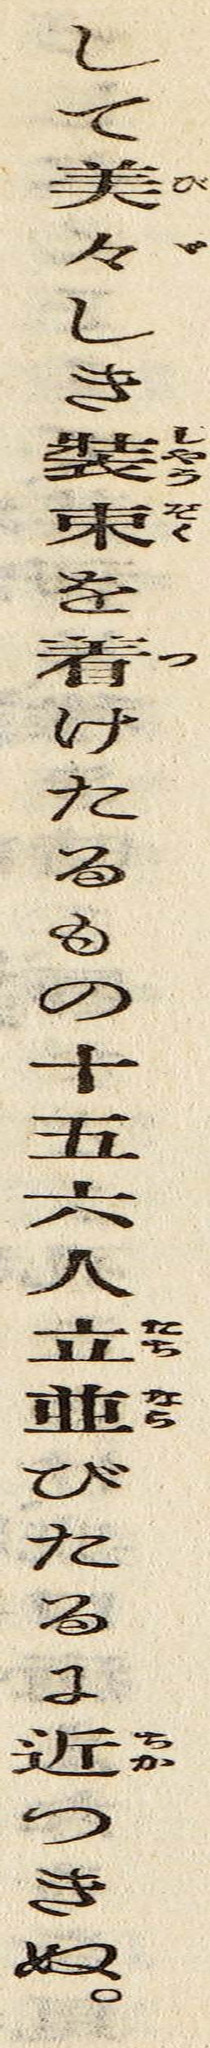して美々しき装束を着けたるもの十五六人立並びたるに近つきぬ。
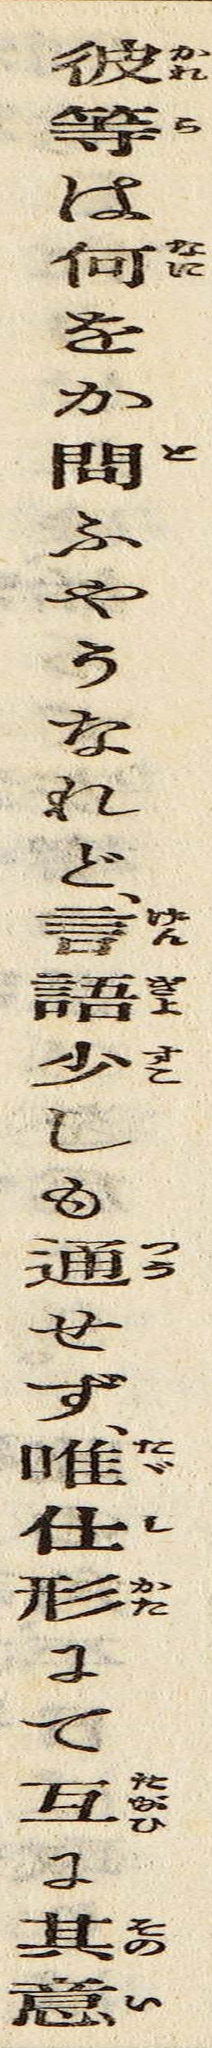彼等は何をか問ふやうなれど、言語少しも通せず、唯仕形にて互其意
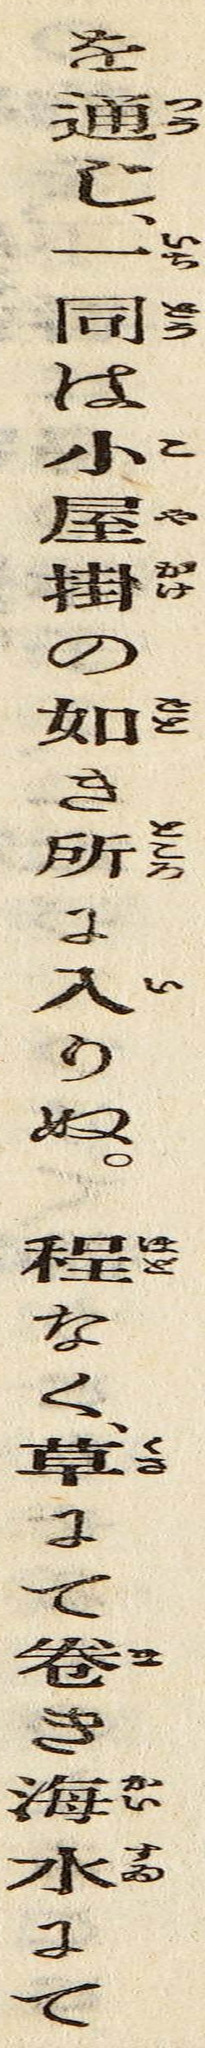を通じ、一同は小屋掛の如き所に入りぬ。程なく、草にて巻き海水にて
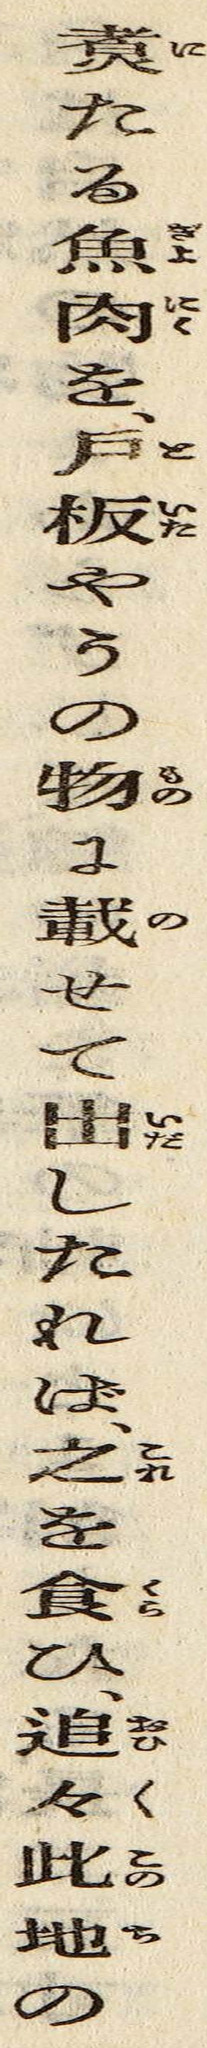煮たる魚肉を、戸板やうの物に載せて出したれば、之を食ひ、追々此地の
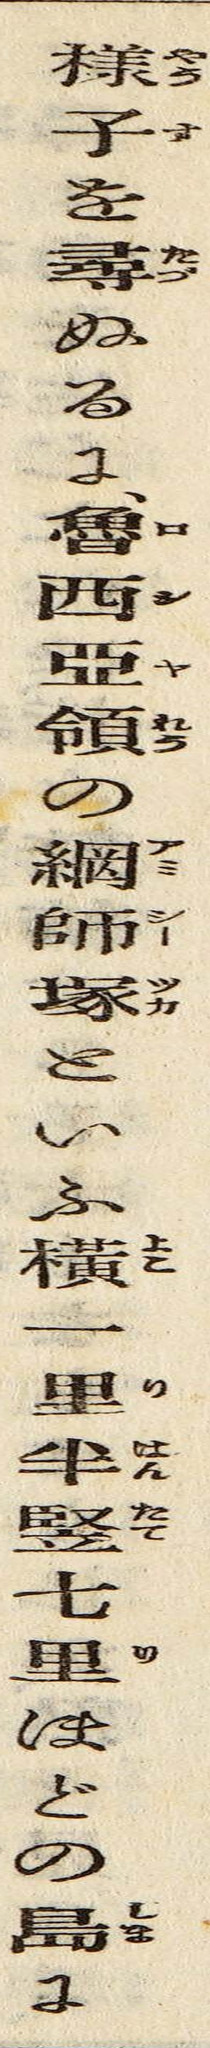様子を尋ぬるに、魯西亜領の網師塚といふ横一里半竪七里ほどの島に
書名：日本漂流譚
